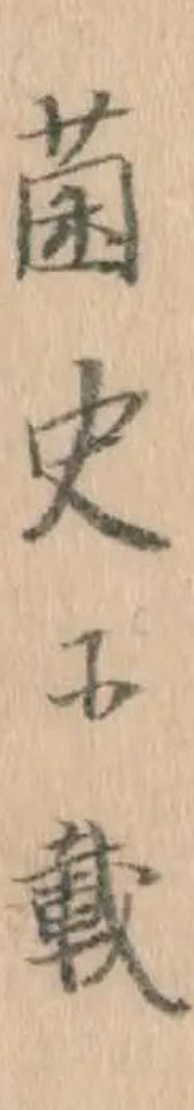菌史に載
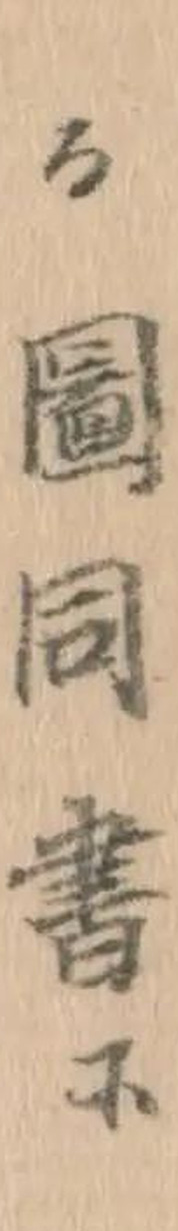る図同書に
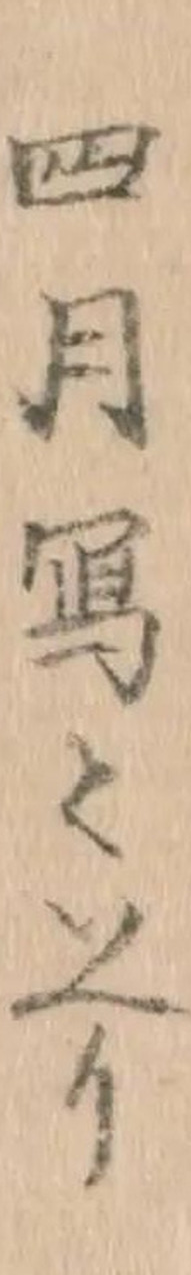四月写といへり

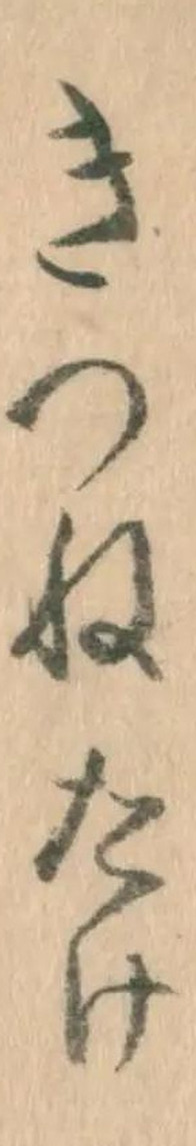きつねたけ
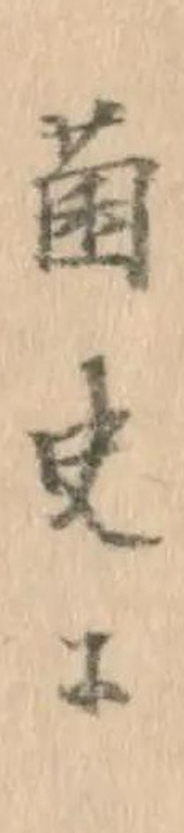菌史に
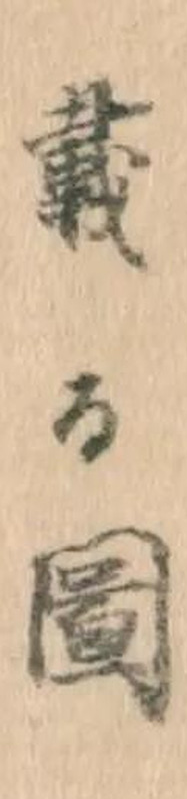載る図

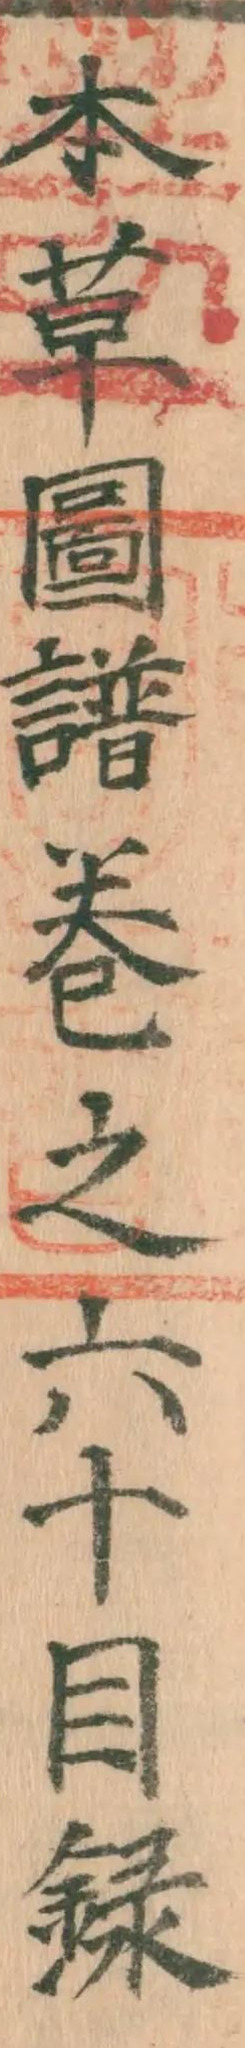本草図譜巻之六十目録

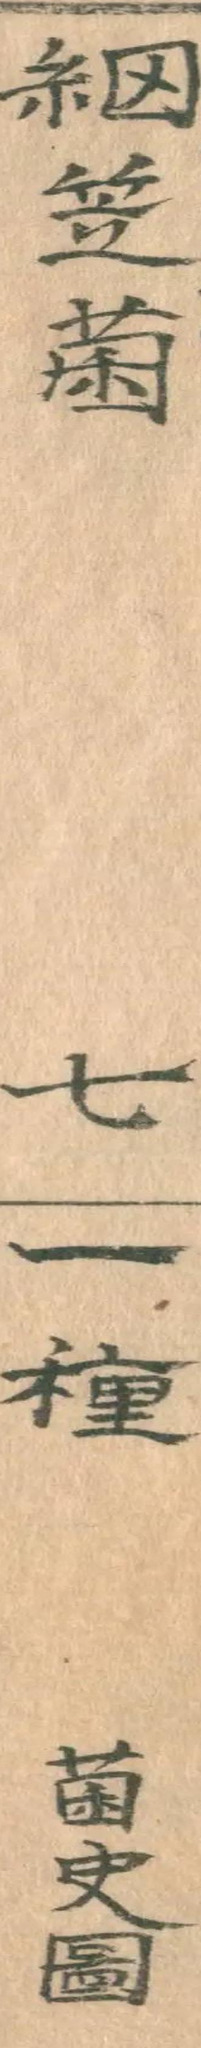網笠菌七一種菌史図
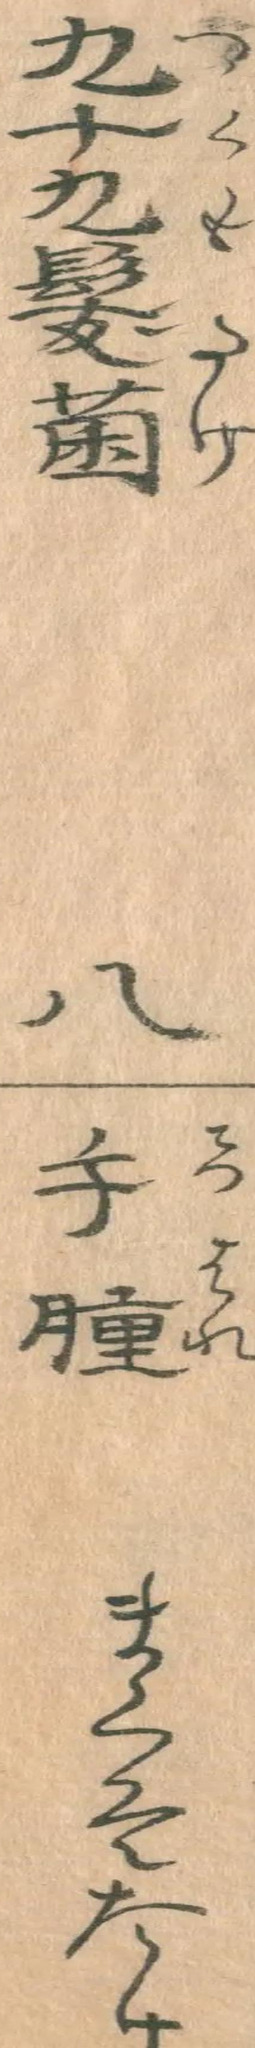九十九髪菌八手腫まくそたけ
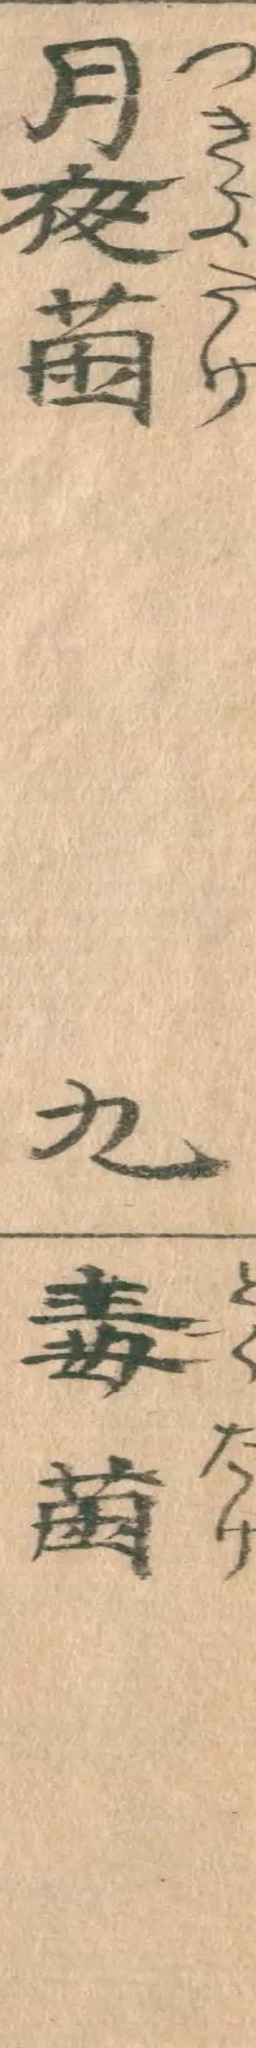月夜菌九毒菌
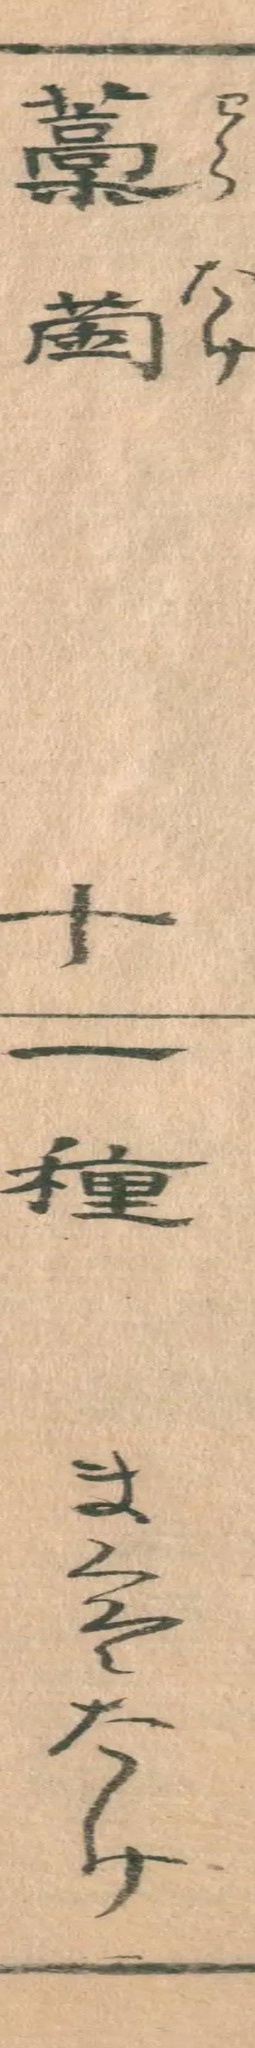藁菌十一種まくそたけ
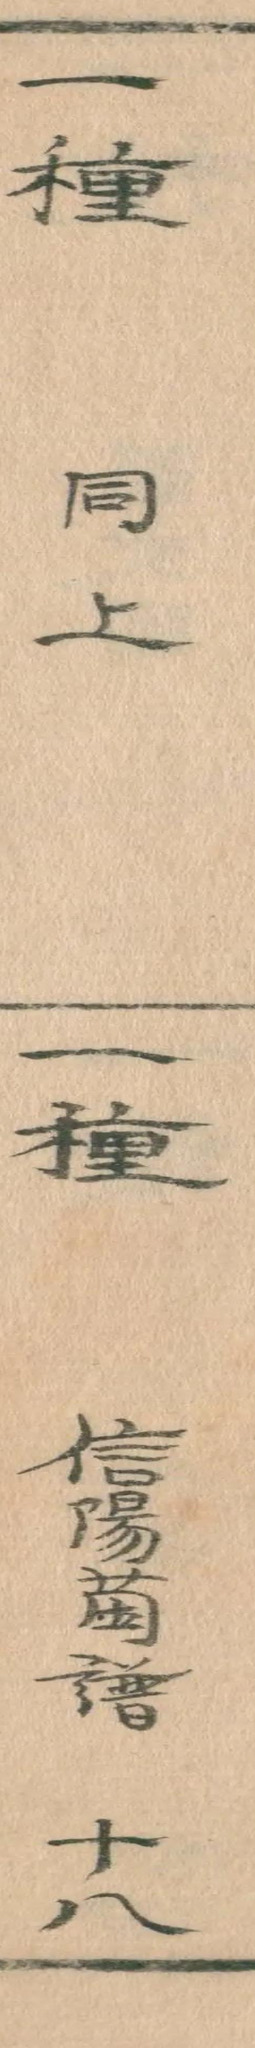一種同上一種信陽菌譜十八
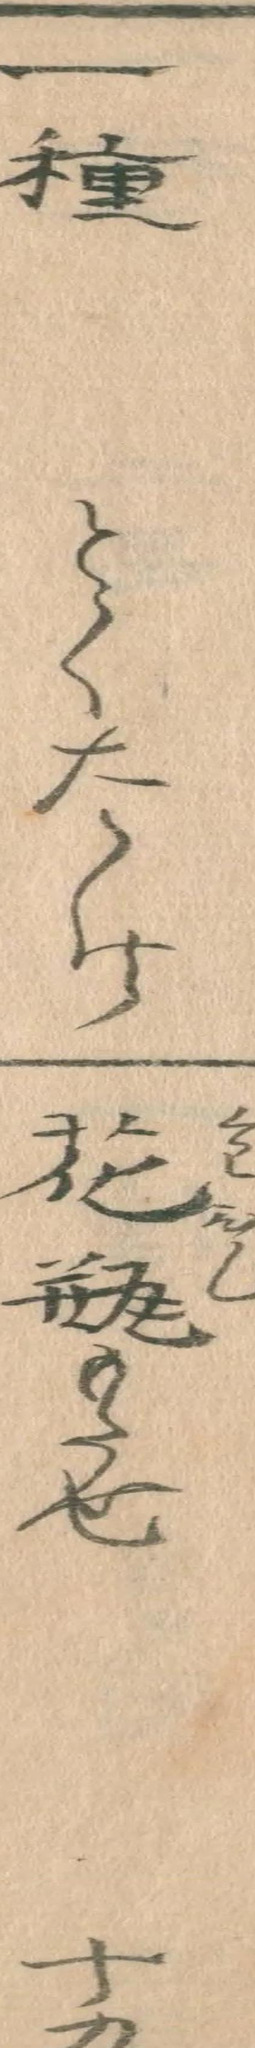一種とくたけ花瓶もたせ十九
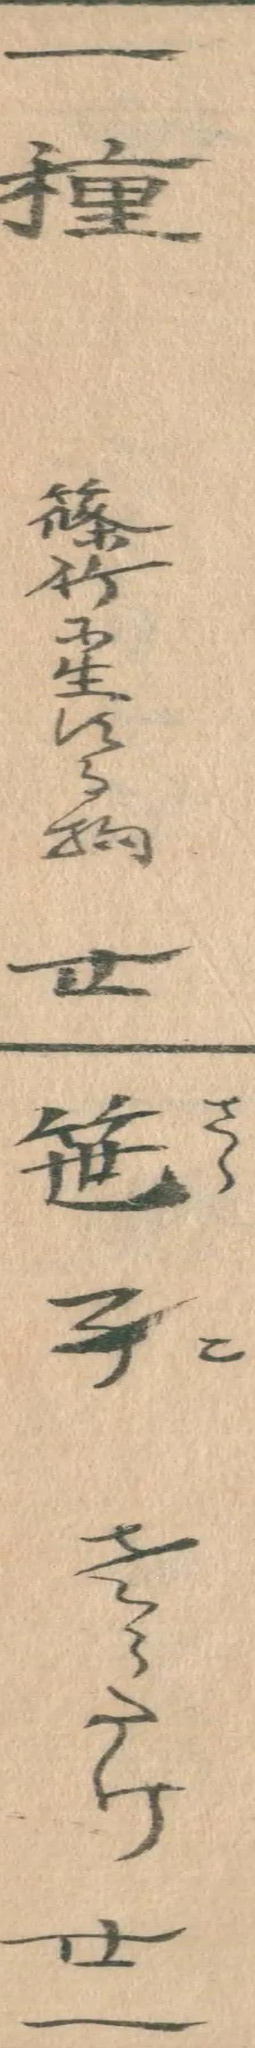一種篠竹に生する物廿笹子さゝたけ廿一

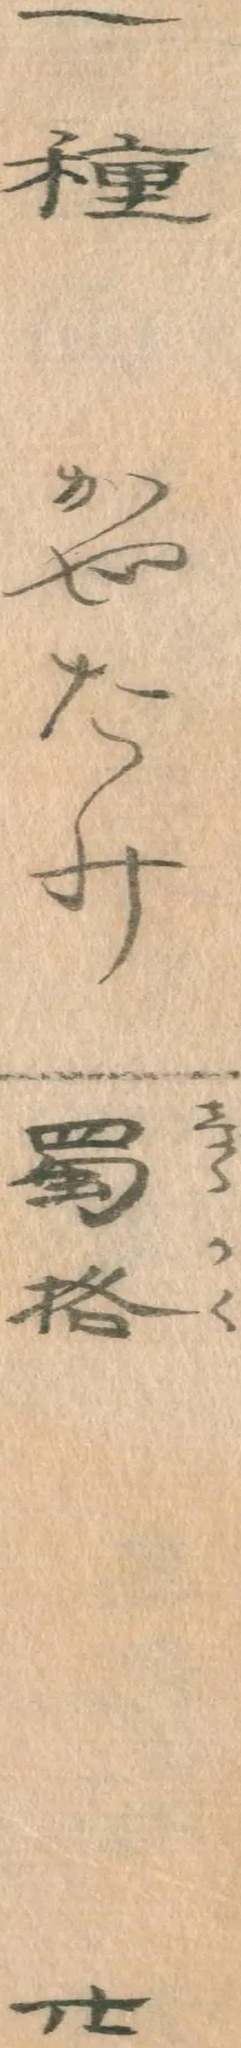一種かやたけ蜀格廿六
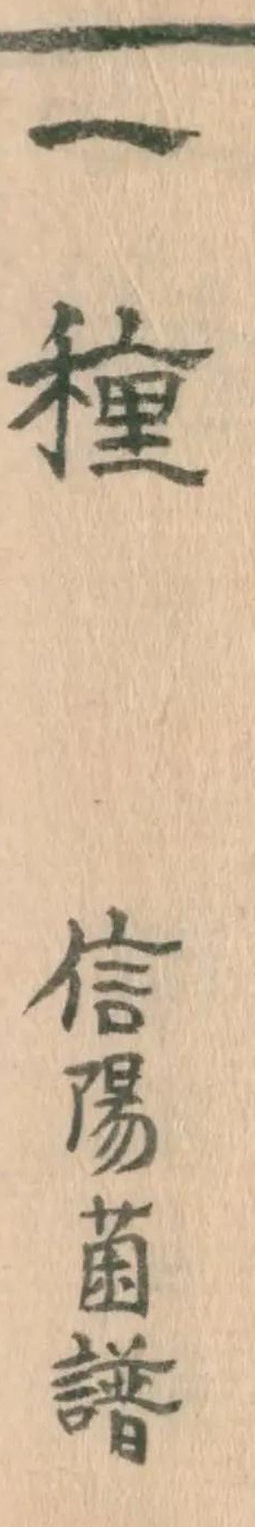一種信陽菌譜
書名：本草図譜. 巻58-60
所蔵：国立国会図書館 National Diet Library, JAPAN
